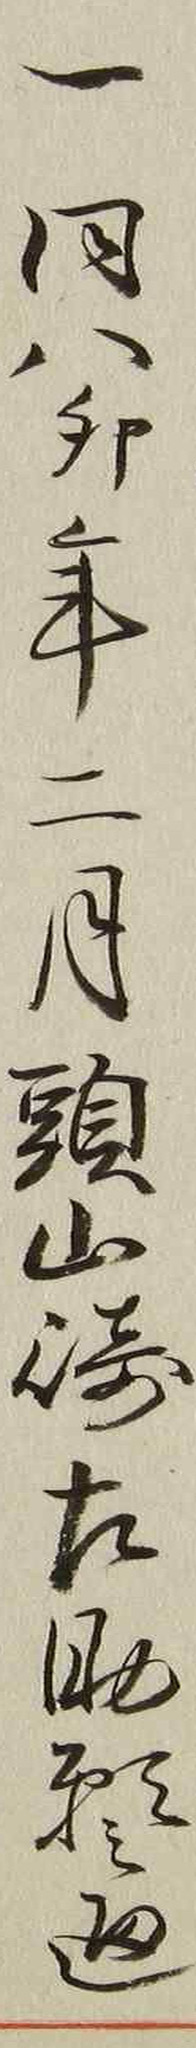一同八卯年二月頭山崎左助願之通
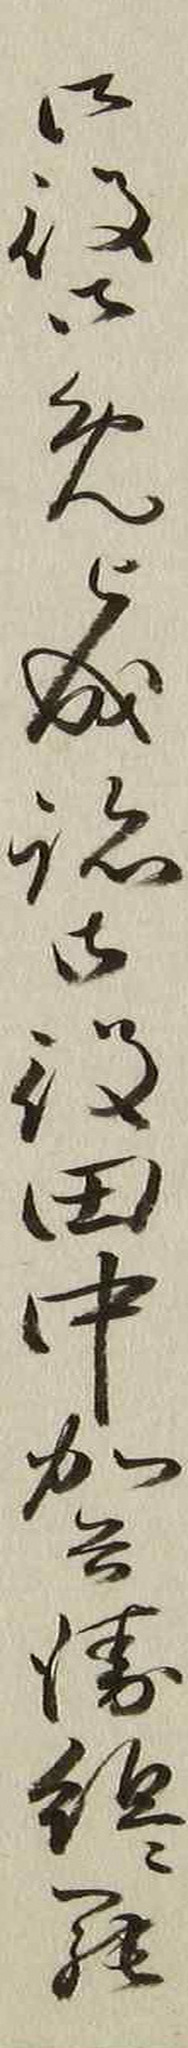御役御免被成跡御役田中加兵衛組ニ罷
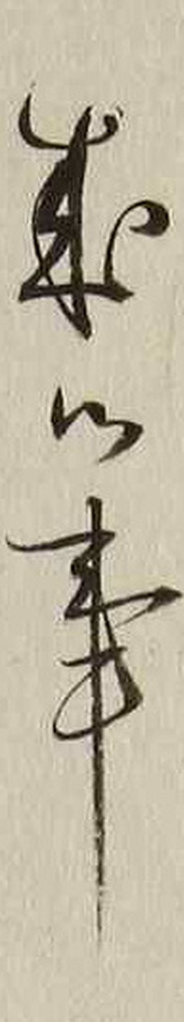成候事
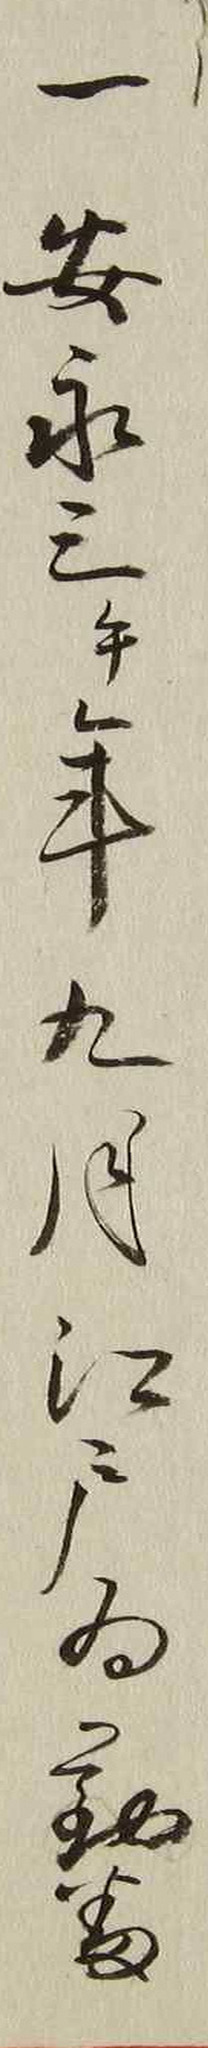一安永三午年九月江戸為勤番
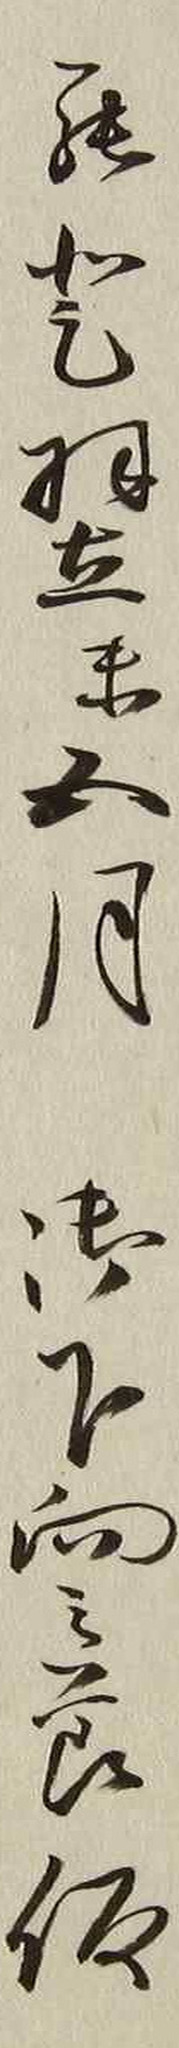罷登翌未五月御下向之節仮
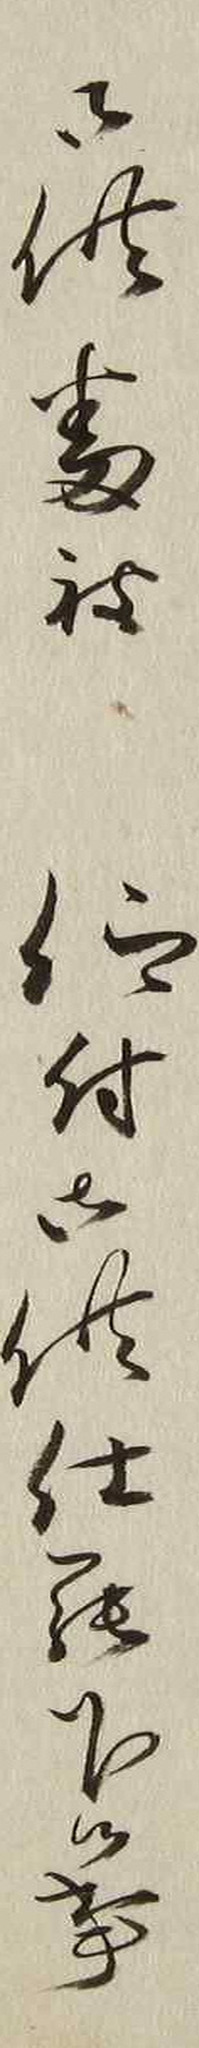御供番被仰付御供仕罷下候事
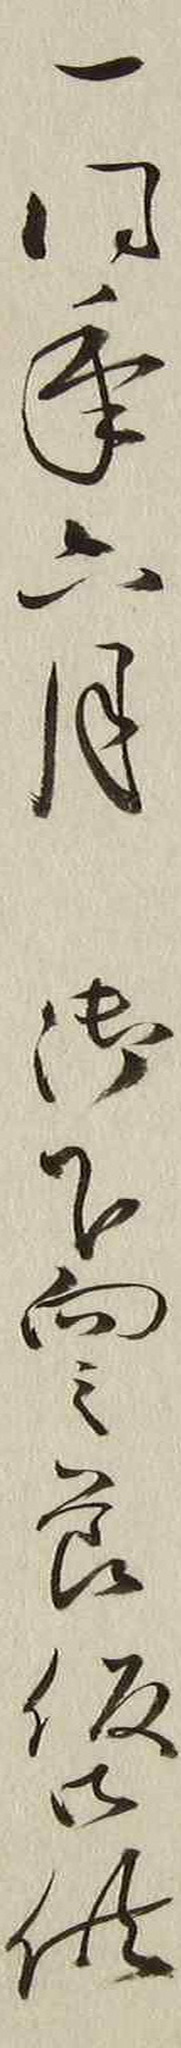一同年六月御下向之節仮御供
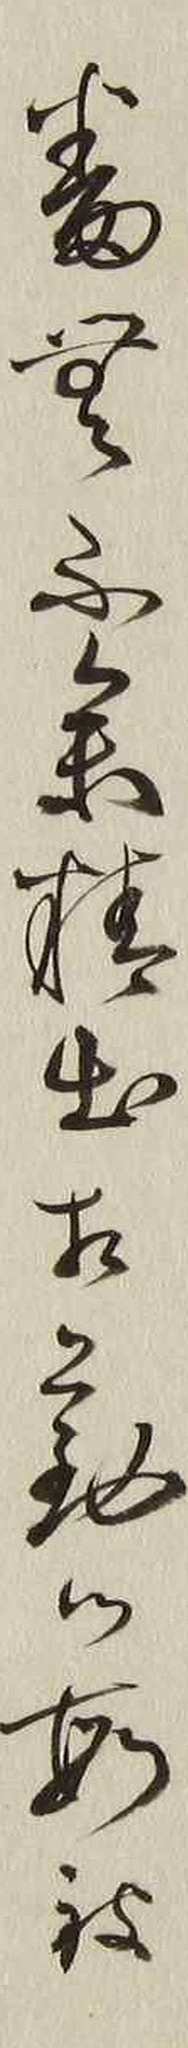番無不参精出相勤候段被
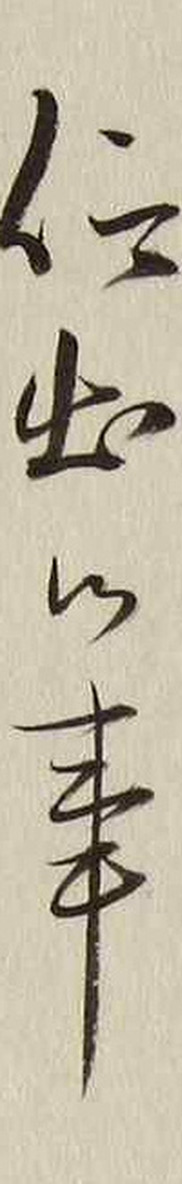仰出候事
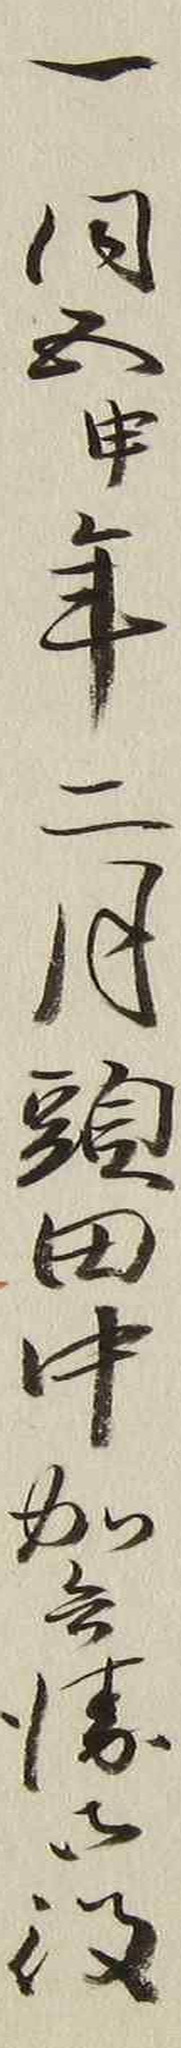一同五申年二月頭田中加兵衛御役
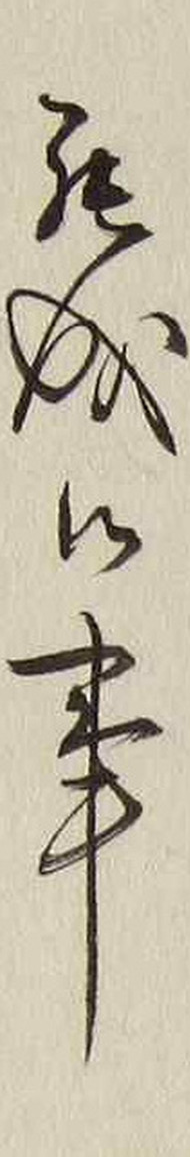罷成候事
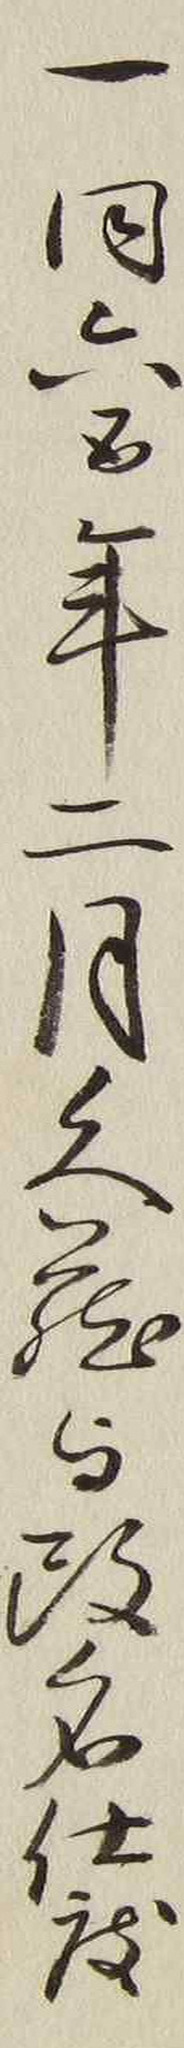一同六酉年二月久蔵と改名仕度
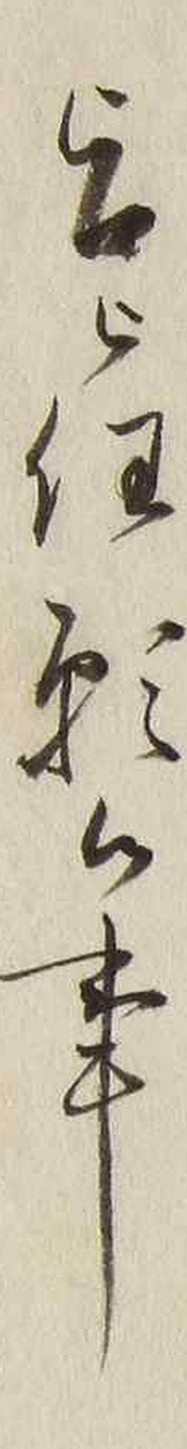旨被任願候事

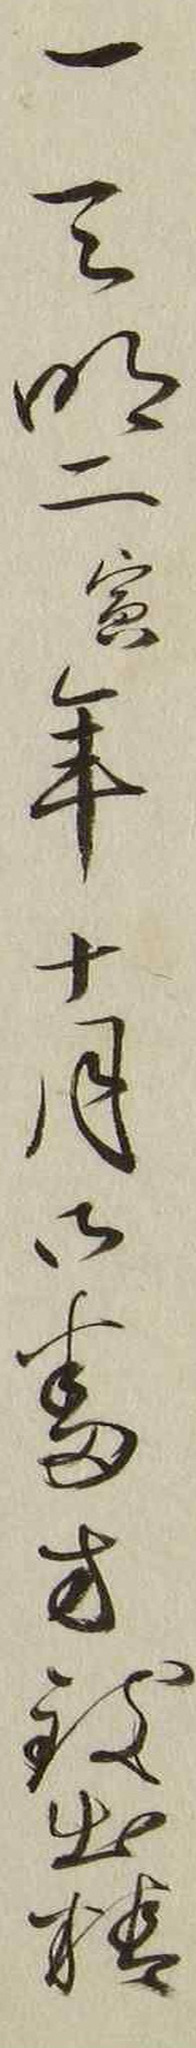一天明二寅年十月御番方致出精
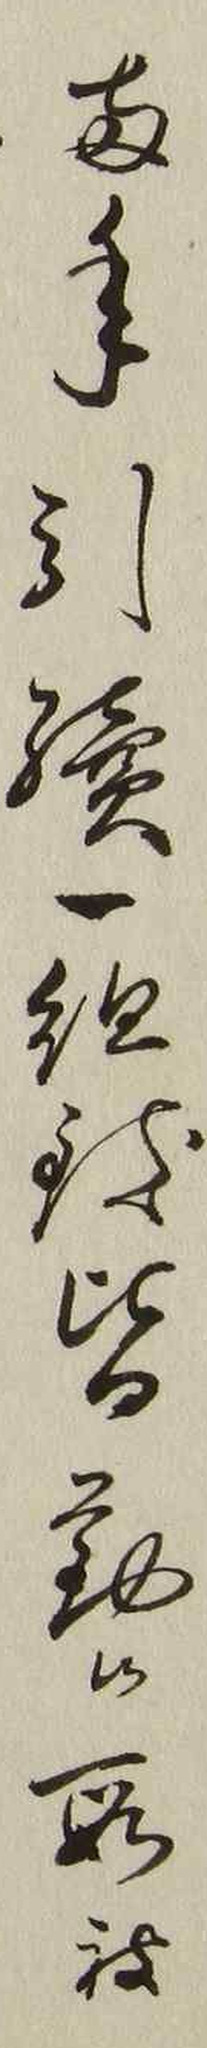両年引続一組致皆勤候段被
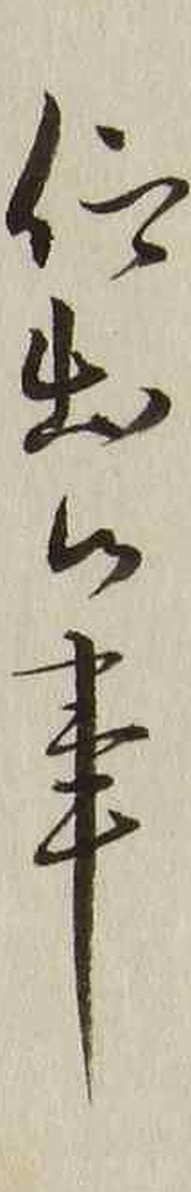仰出候事
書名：諸士系譜　巻之163　な之部5
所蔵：会津若松市立会津図書館
